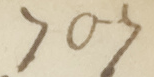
707
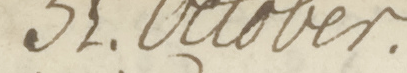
31. October.
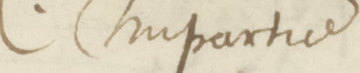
C. Mipartie
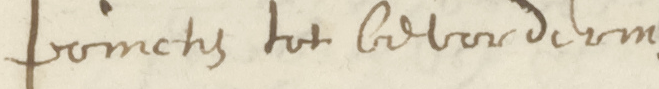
Poincten tot bevoorderinge
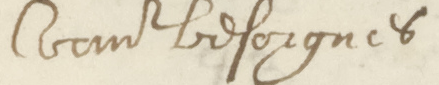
van besoignes
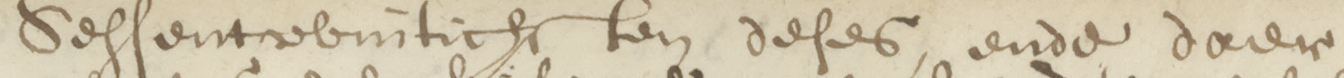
Sessentwintichsten deses, ende daer
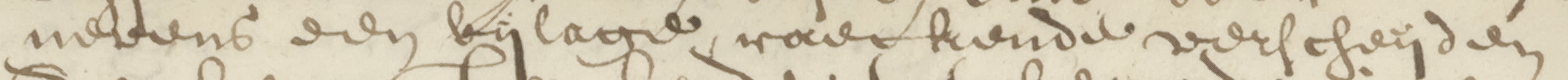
nevens een bijlage, raeckende verscheijden
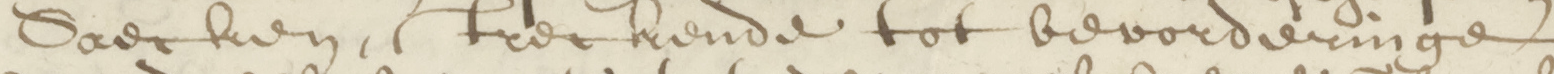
Saecken, streckende tot bevorderinge
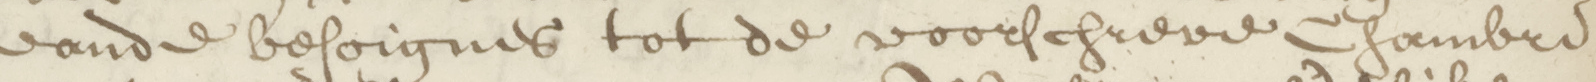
vande besoignes tot de voorschreve Chambre
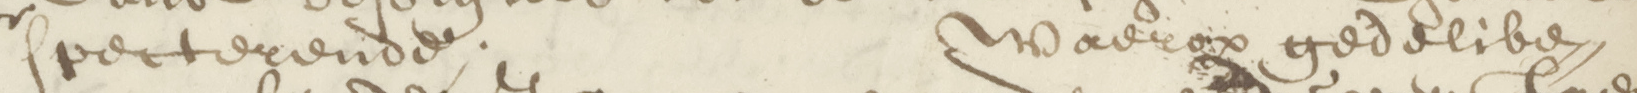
specterende; Waerop gedelibe„
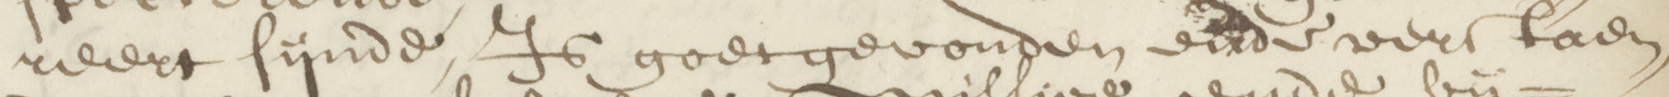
reert sijnde, Is goetgevonden ende verstaen,
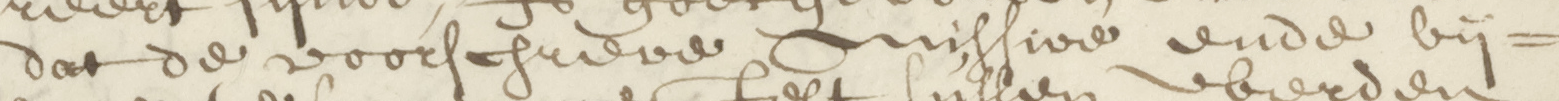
dat de voorschreve Missive ende bij=
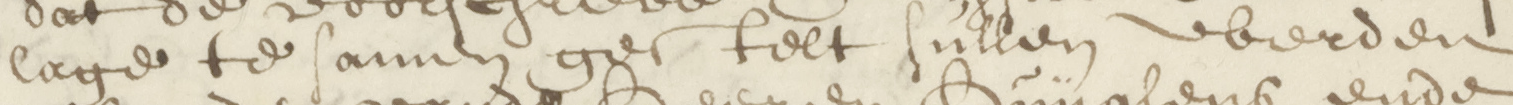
lage te samen gestelt sullen werden
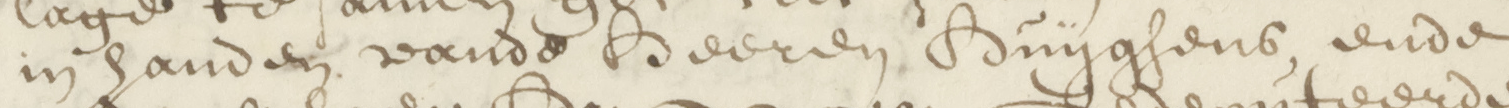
in handen vande Heeren Huijghens, ende
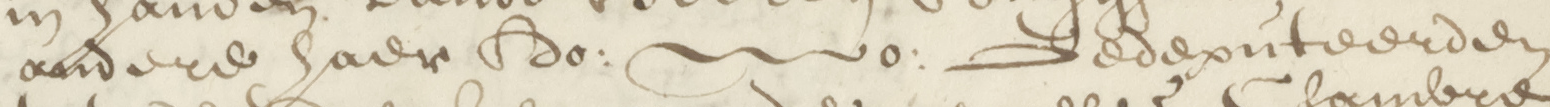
andere haer Ho:Mo: Gedeputeerden
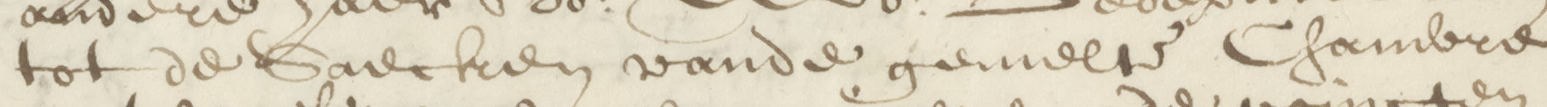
tot de Saecken vande gemelte Chambre
